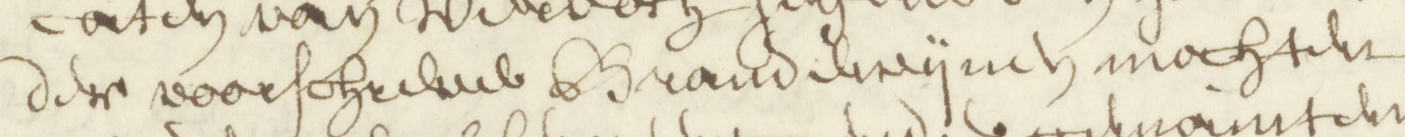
der voorschreve Brandewijnen mochten
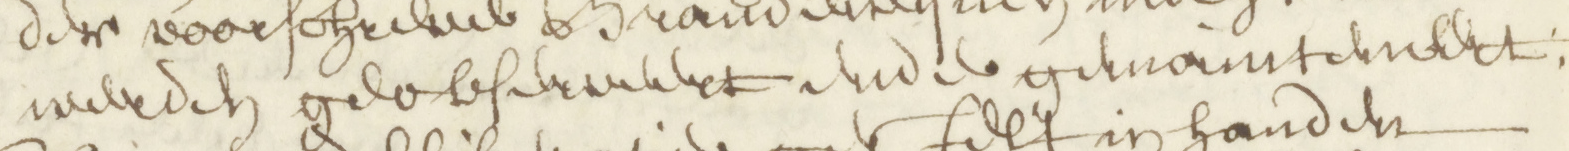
werden geobserveert ende gemainteneert;
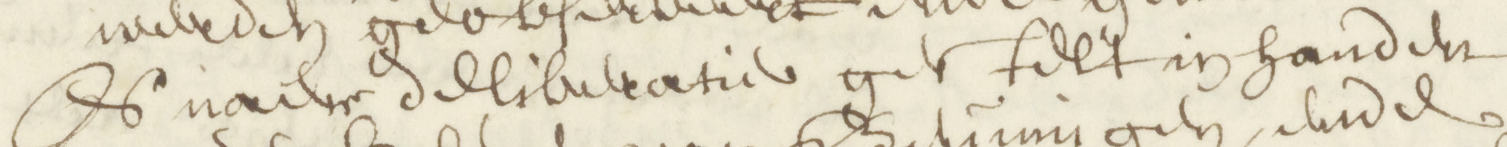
Is naer deliberatie gestelt in handen
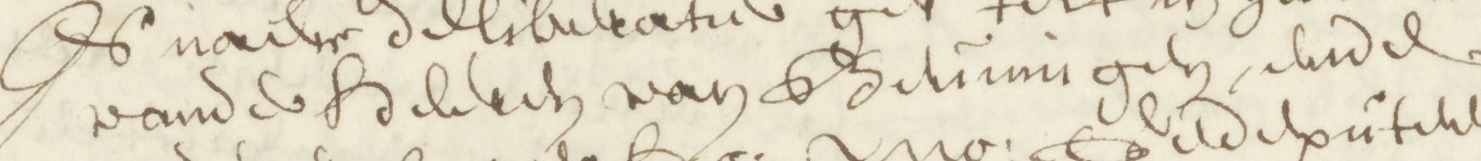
vande Heeren van Beuningen, ende
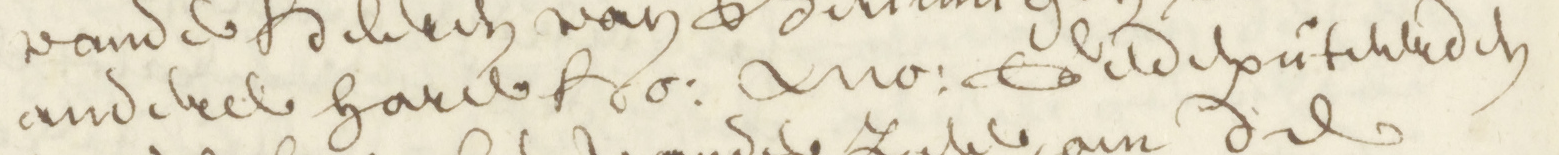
andere hare Ho:Mo: Gedeputeerden
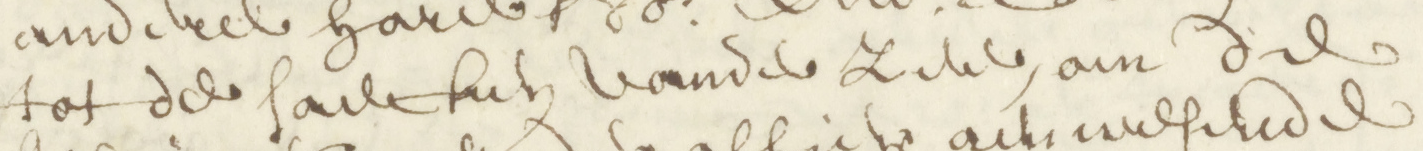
tot de saecken vande Zee, om de
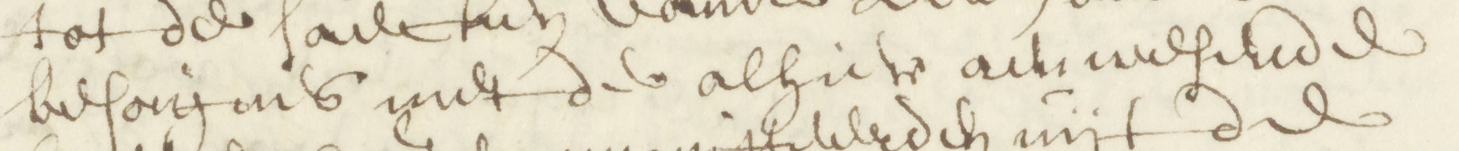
besoignes met de alhier aenwesende
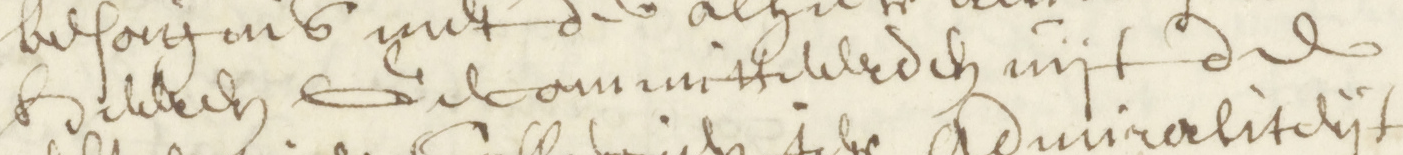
Heeren Gecommitteerden uijt de
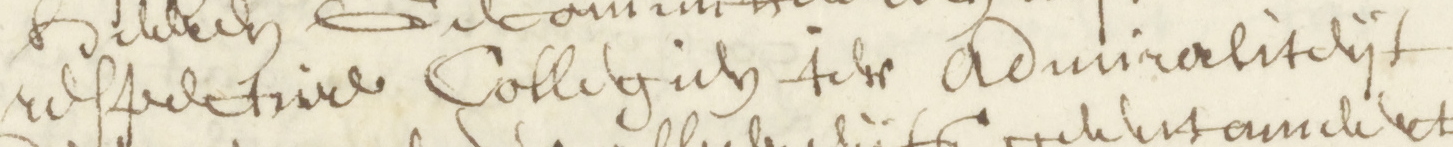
respective Collegien ter Admiraliteijt
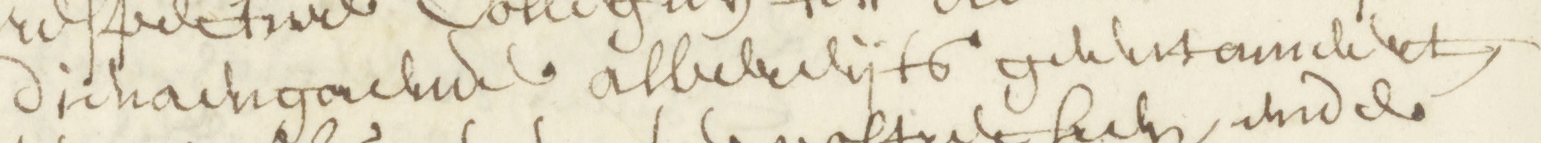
dienaengaende albereijts geentameert,
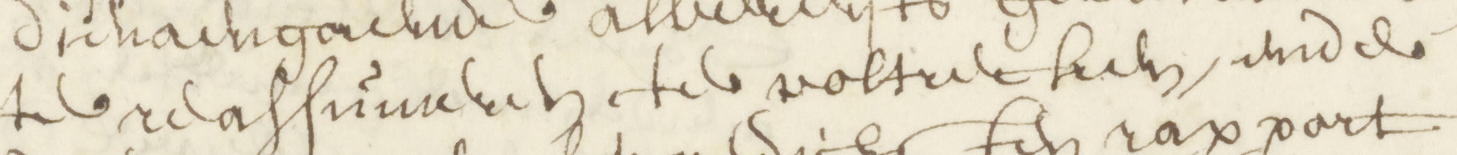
te reassumeren te voltrecken, ende
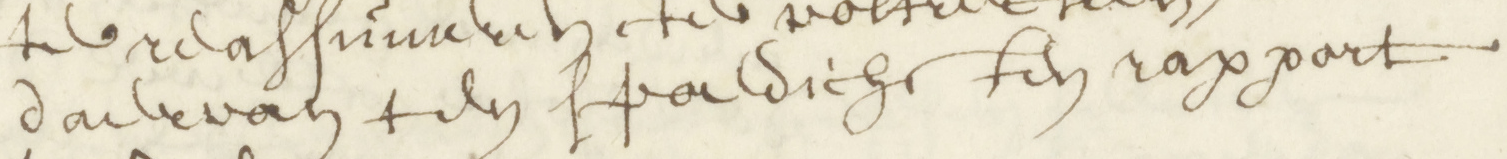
daervan ten spoedichsten rapport
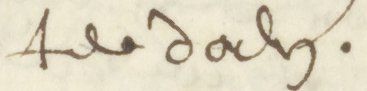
te doen.
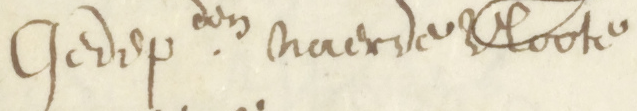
Gedepden. naerde Vloote
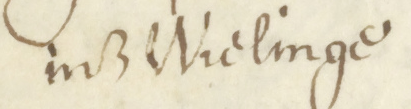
in Wielinge
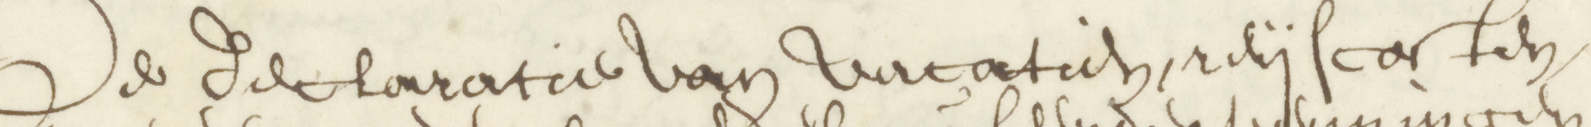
De declaratie van vacatien, reijscosten,
